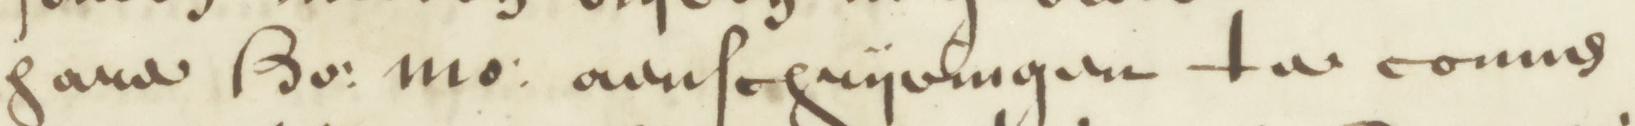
hare Ho: Mo: aenschrijvingen toe connnen
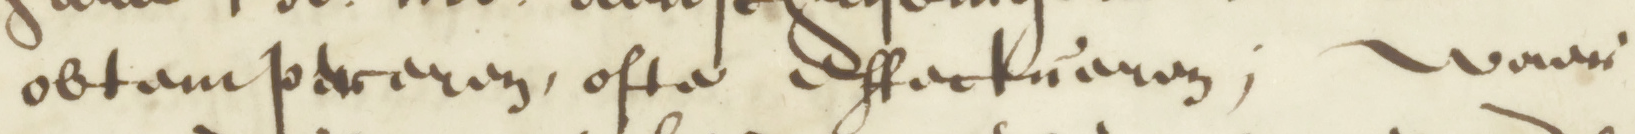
obtempereren, ofte effectueren; Waer
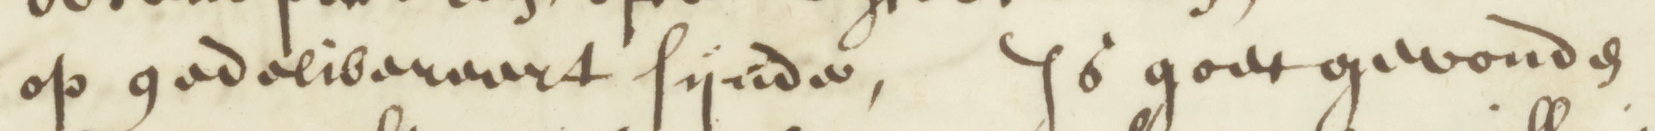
op gedelibereert sijnde, Is goet gevonden
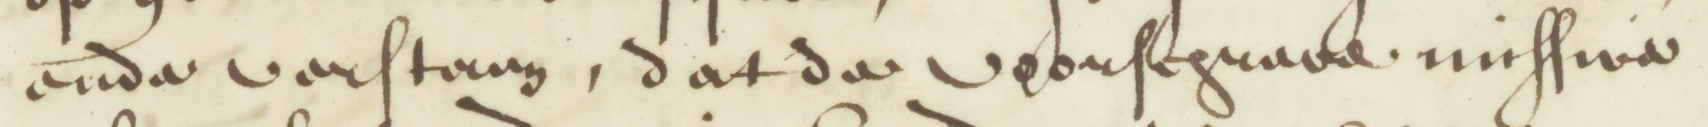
ende verstaen, dat de voorschreve missive
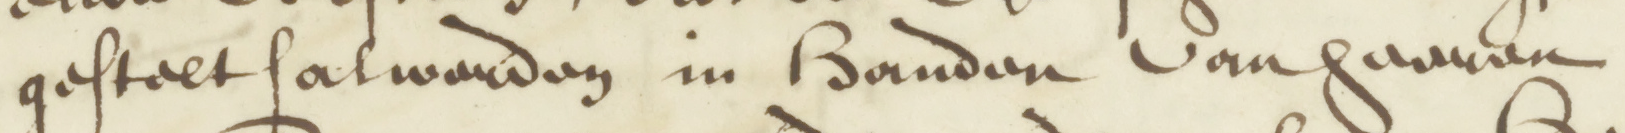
gestelt sal werden in handen van heeren
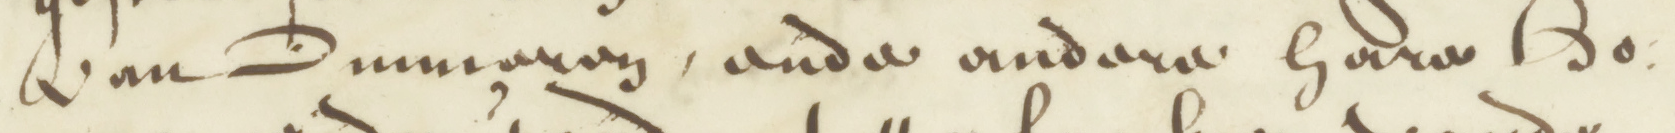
van Ommeren, ende andre hare Ho:
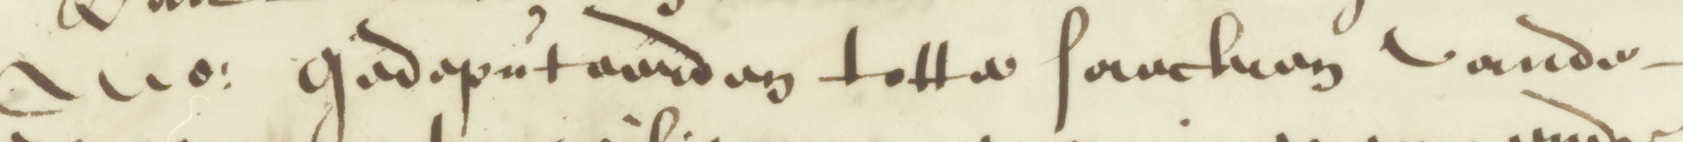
Mo: gedeputeerden totte saecken vande
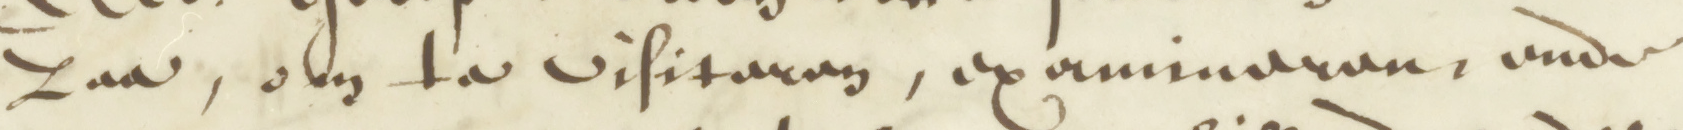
zee, om te visiteren, examineren, ende
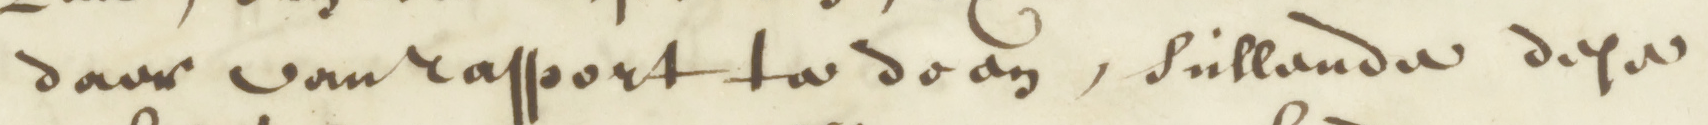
daer van rapport te doen, sullende dese
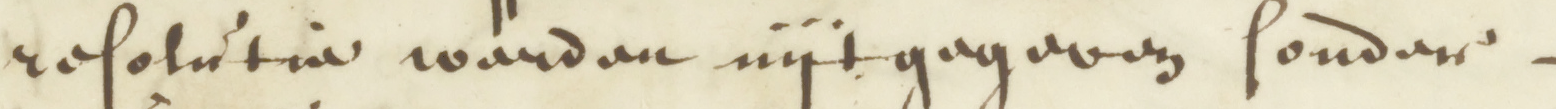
resolutie worden uijtgegeven sonder
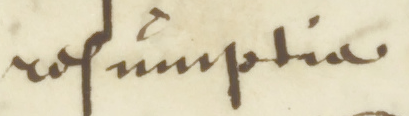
resumptie.
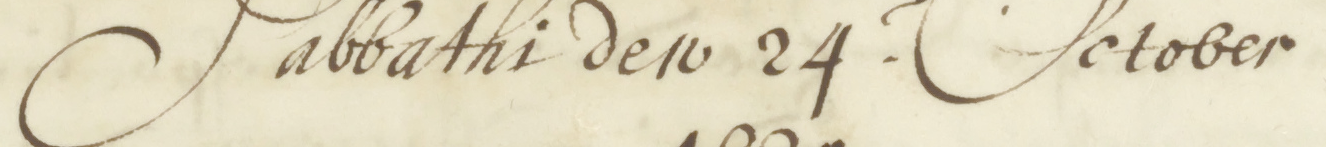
Sabbathi den 24e. October
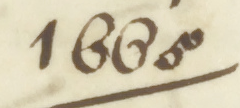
1665
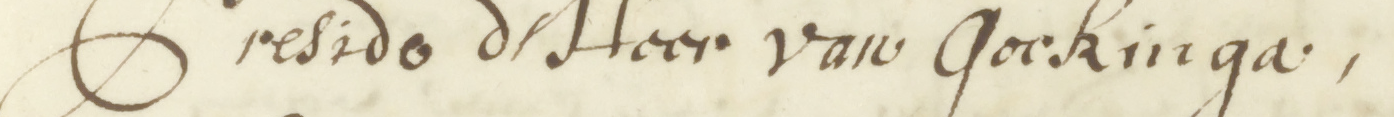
Preside d'Heer van Gockinga,
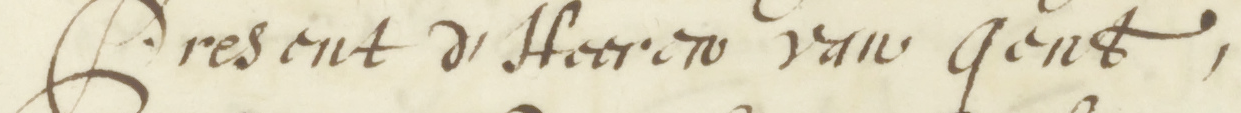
Present d'Heeren van Gent,
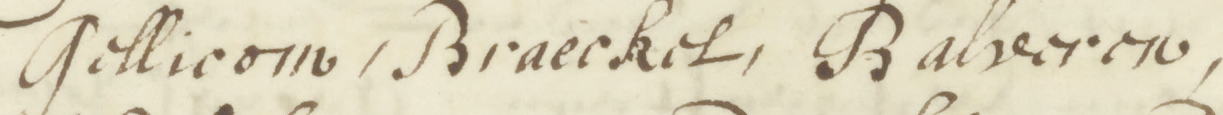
Gellicom, Braeckel, Balveren,
